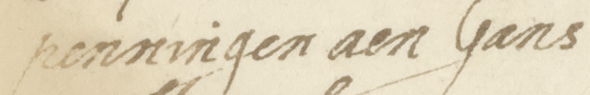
penningen aen Gans
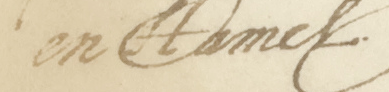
en Hamel.
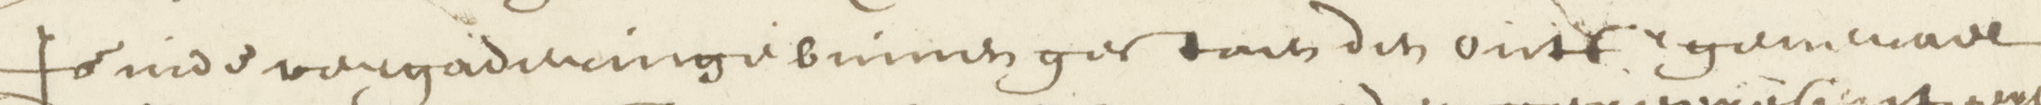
Is inde vergaderinge binnen gestaen den ontfr. generael
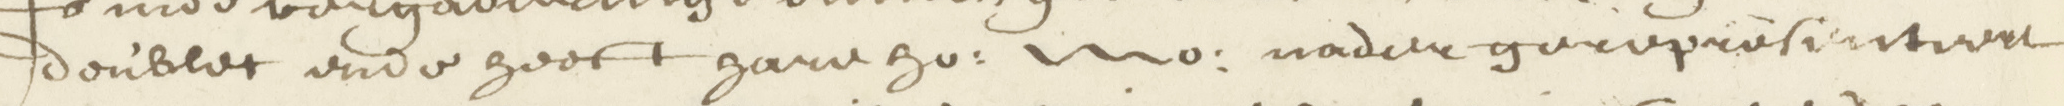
Doublet ende heeft hare Ho:Mo: nader gerepresenteert
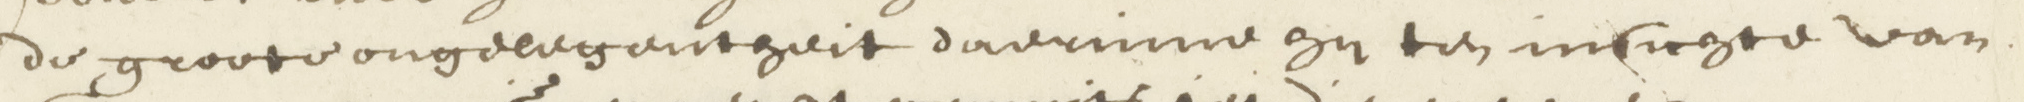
de groote ongelegentheit daerinne hy ten insichte van
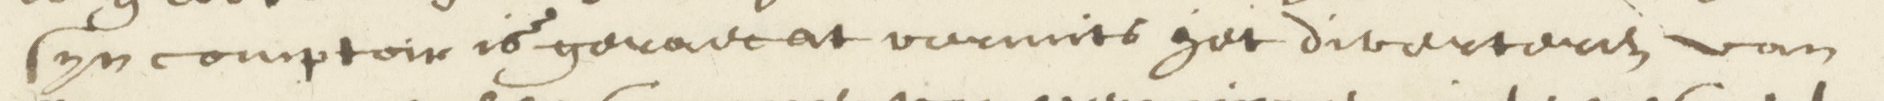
syn comptoir is geraeckt vermits het diverteren van
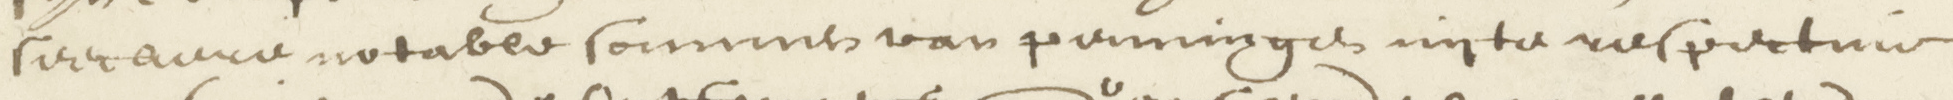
seeckere notable sommen van penningen uyte respectiue
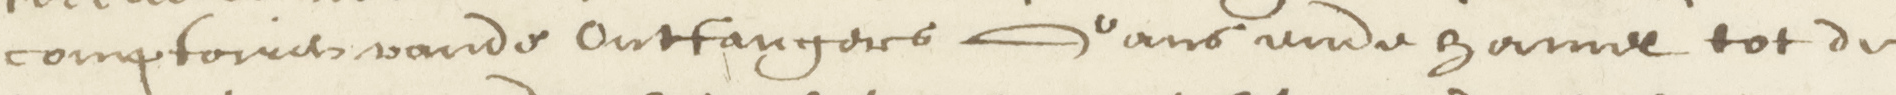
comptoiren vande Ontfangers Gans ende hamel tot de
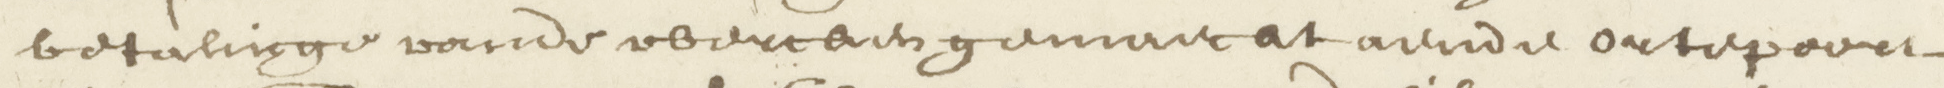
betalinge vande wercken gemaeckt aende ortepoort
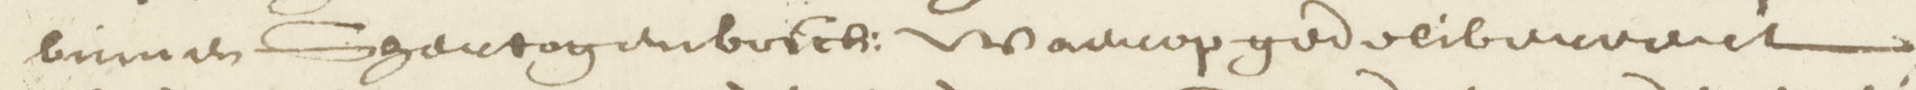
binnen Shertogenbosch: Waerop gedelibereert
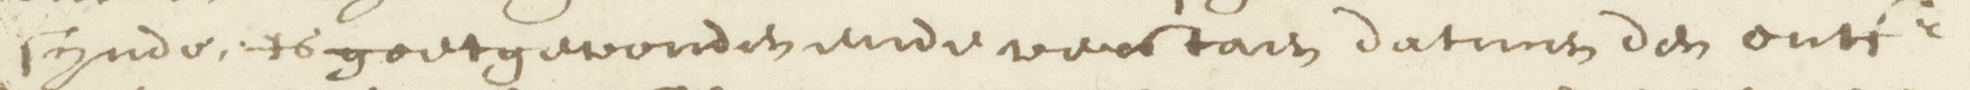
synde, Is goetgevonden ende verstaen datmen den ontfr.
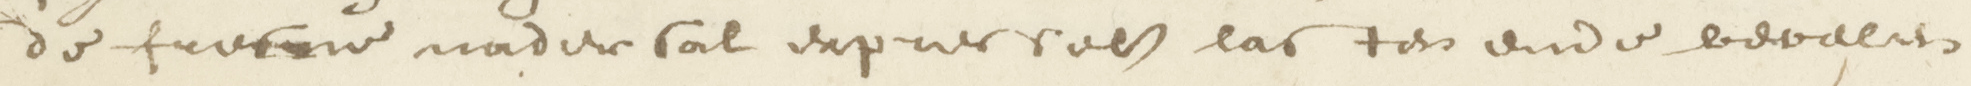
de fresne nader sal expressel lasten ende bevelen
